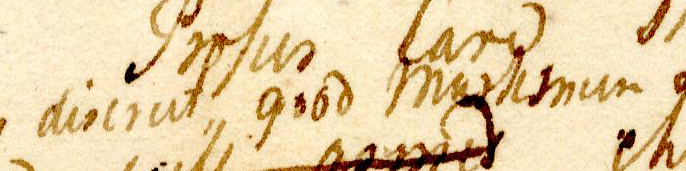direct, good Marksmen
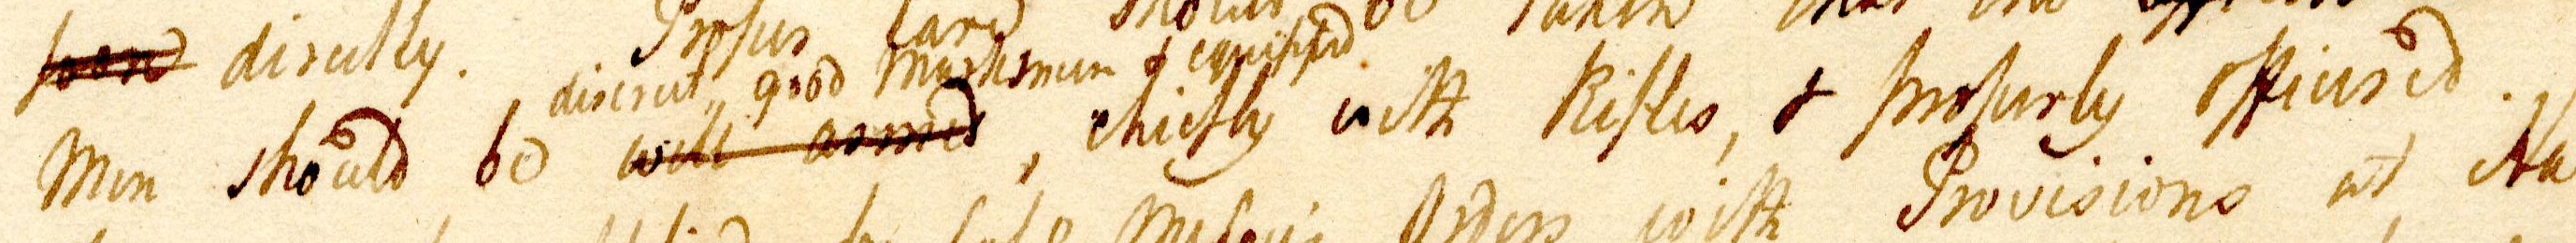men should be [well armed], chiefly with Rifles, & properly officered.
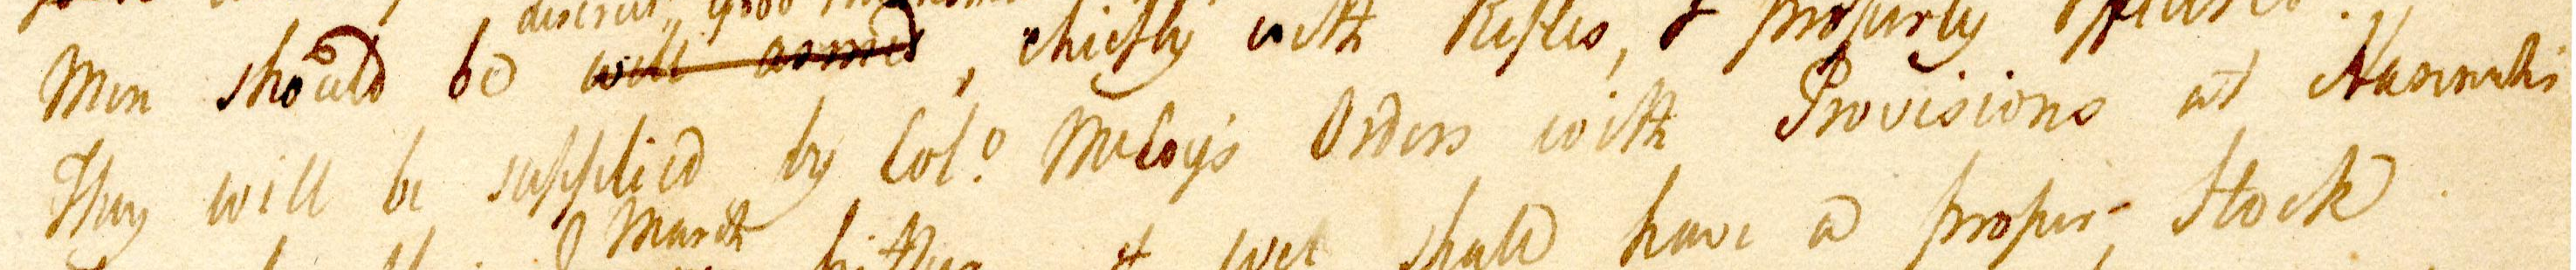They will be supplied by Col^o. M^cCoy's Orders with Provisions at Hannahs
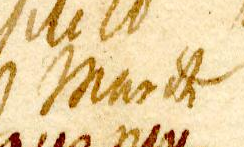March
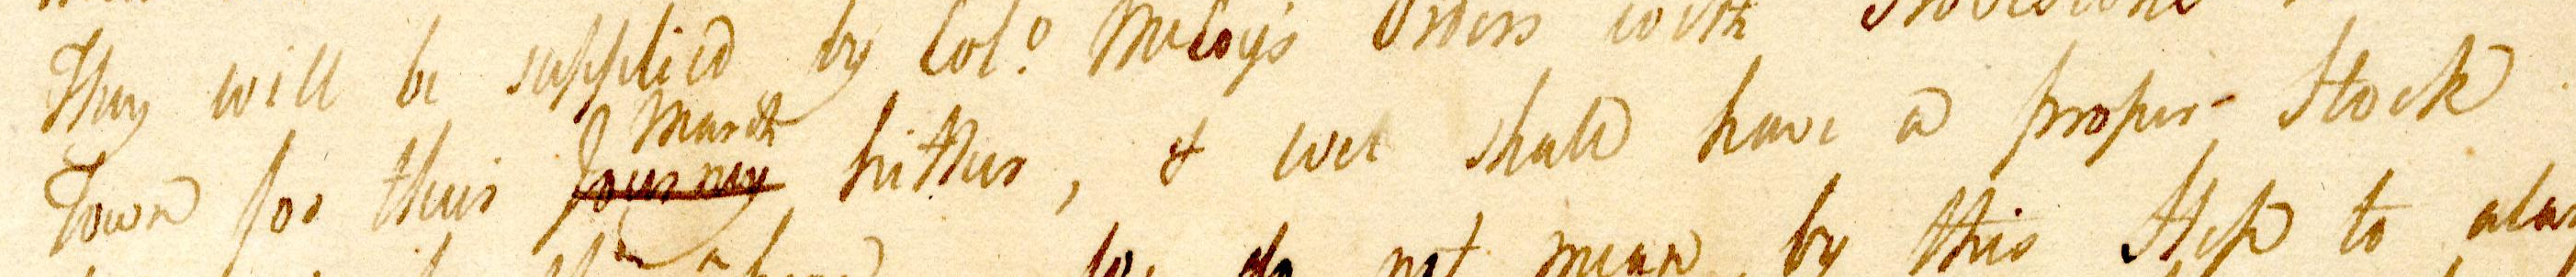Town for their ^ journey hither, & we shall have a proper Stock
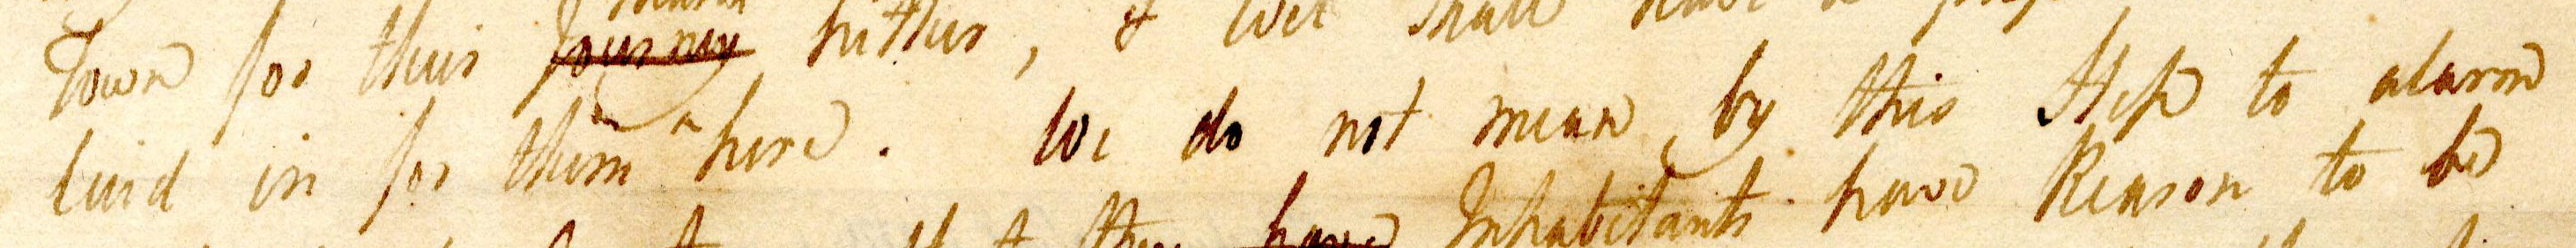laid in for them here. We do not mean by this Step to alarm
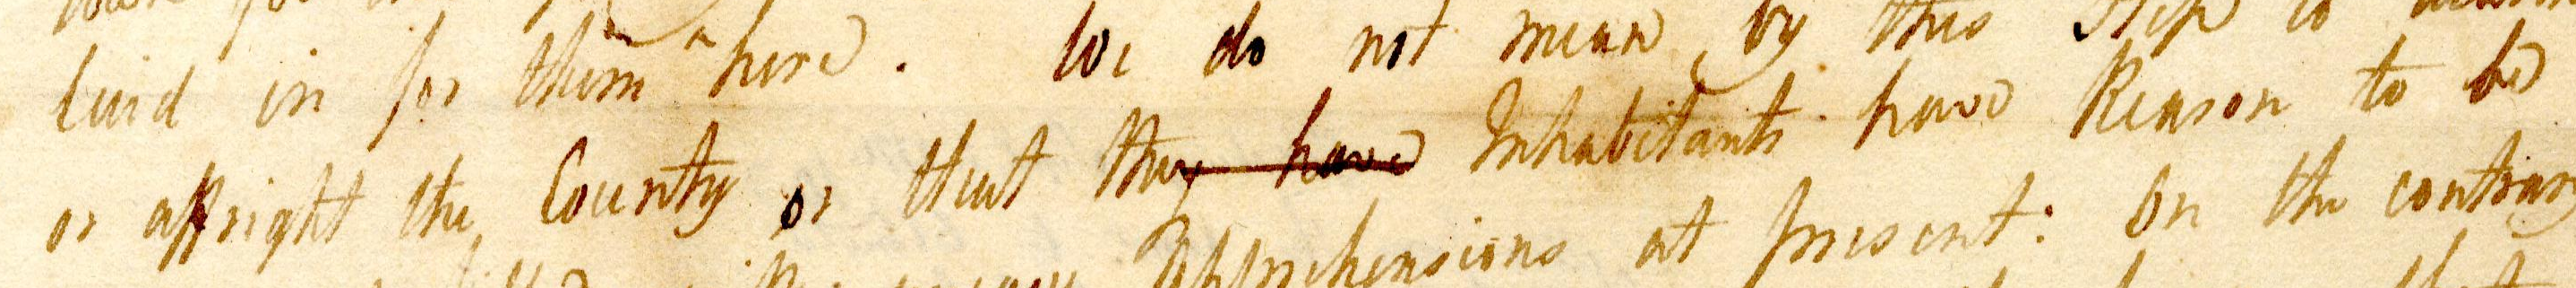or affright the Country or that [they have] Inhabitants have Reason to be
